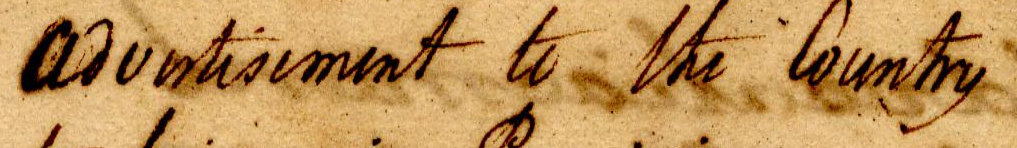Advertisement to the Country
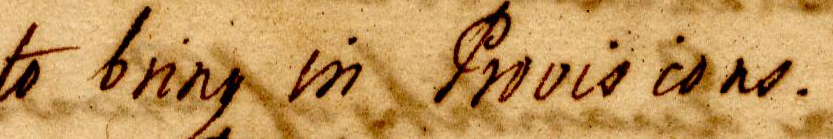to bring in Provisions.
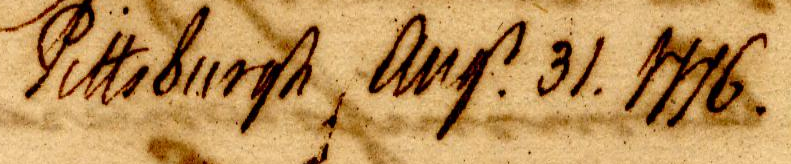Pittsburgh Aug. 31. 1776.
